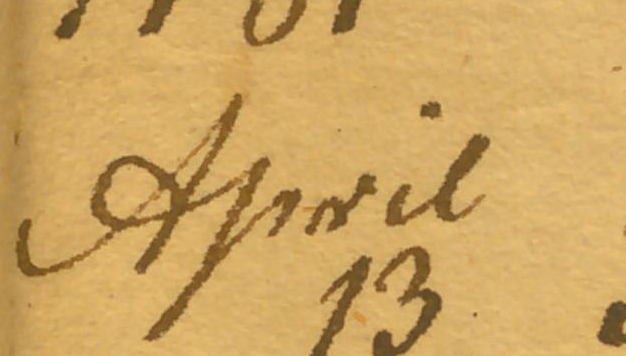April
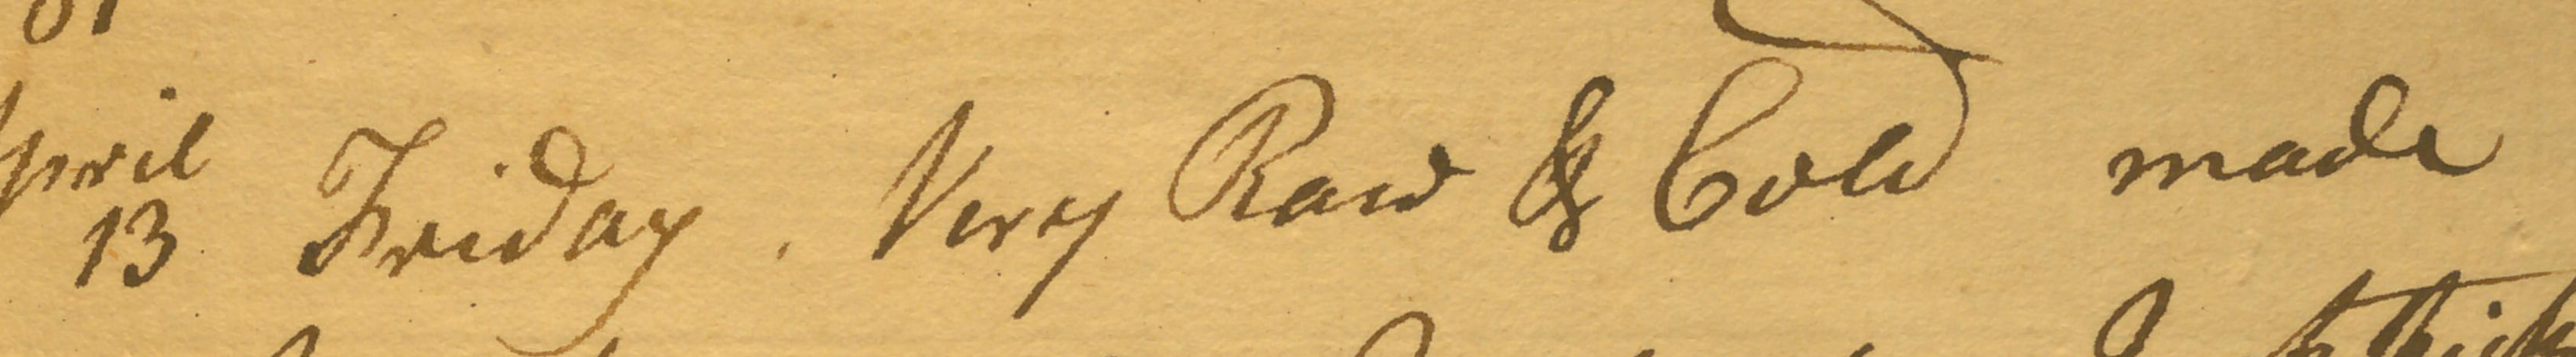13 Friday. Very Raw & Cold made
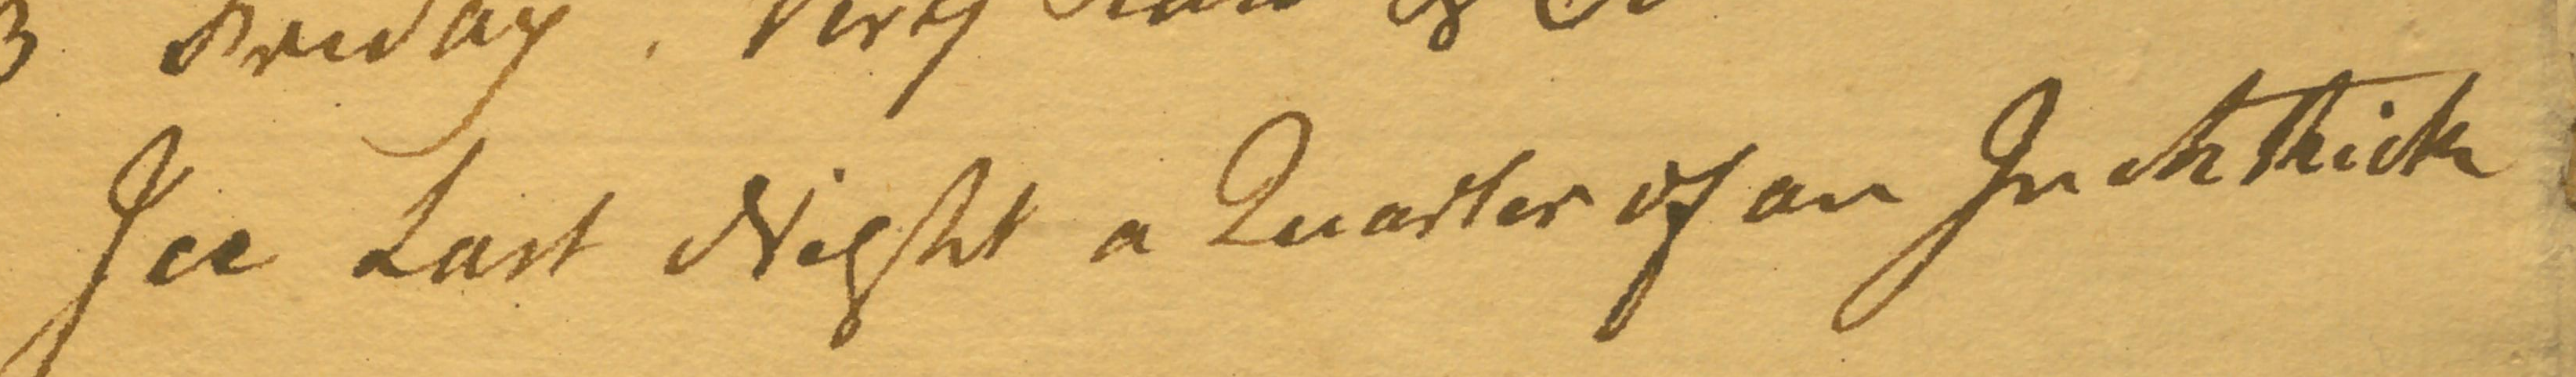Ice Last Night a Quarter of an Inch thick
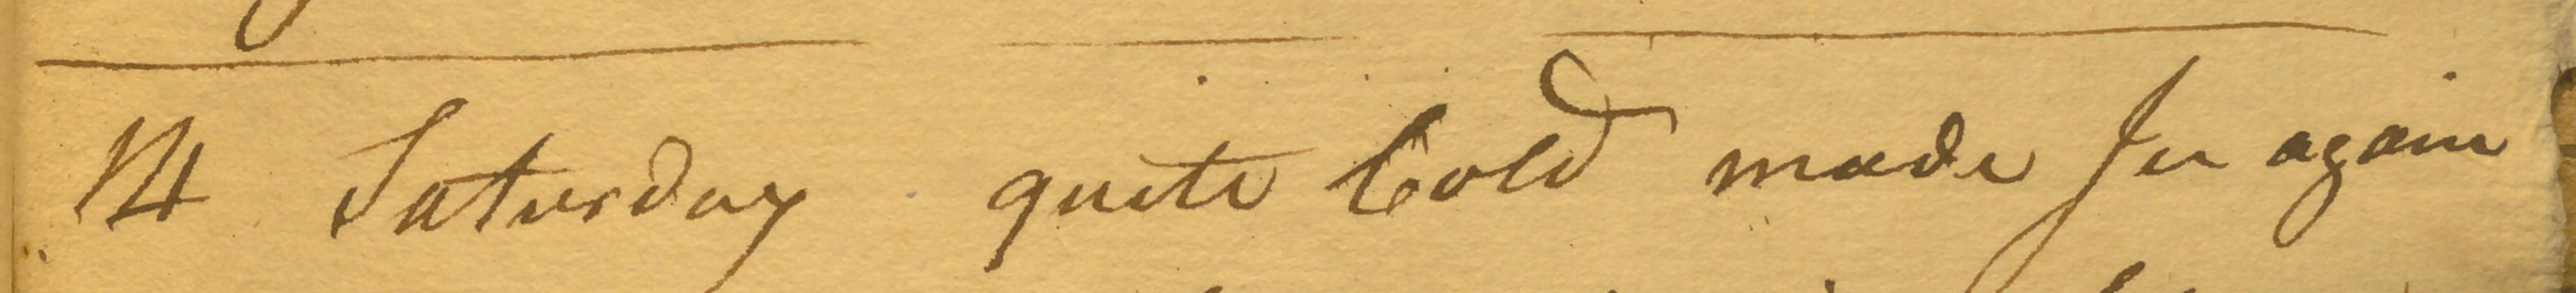14 Saturday quite Cold made Ice again
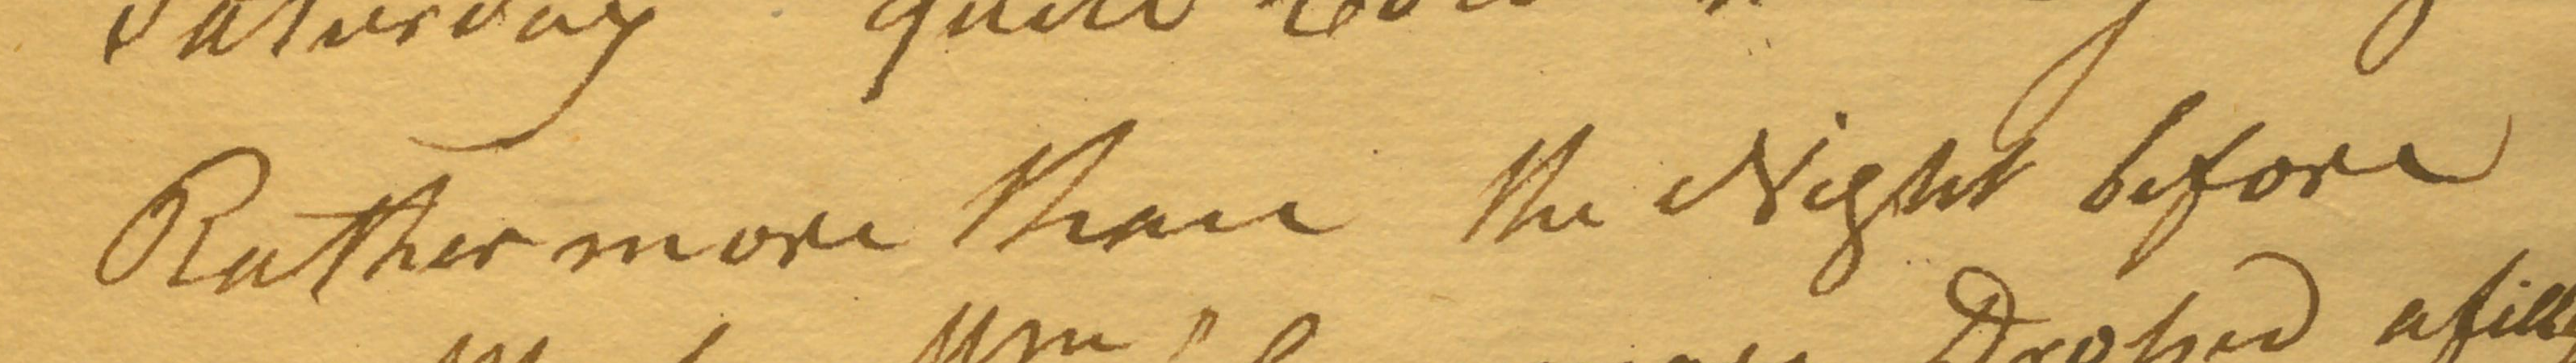Rather more than the Night before
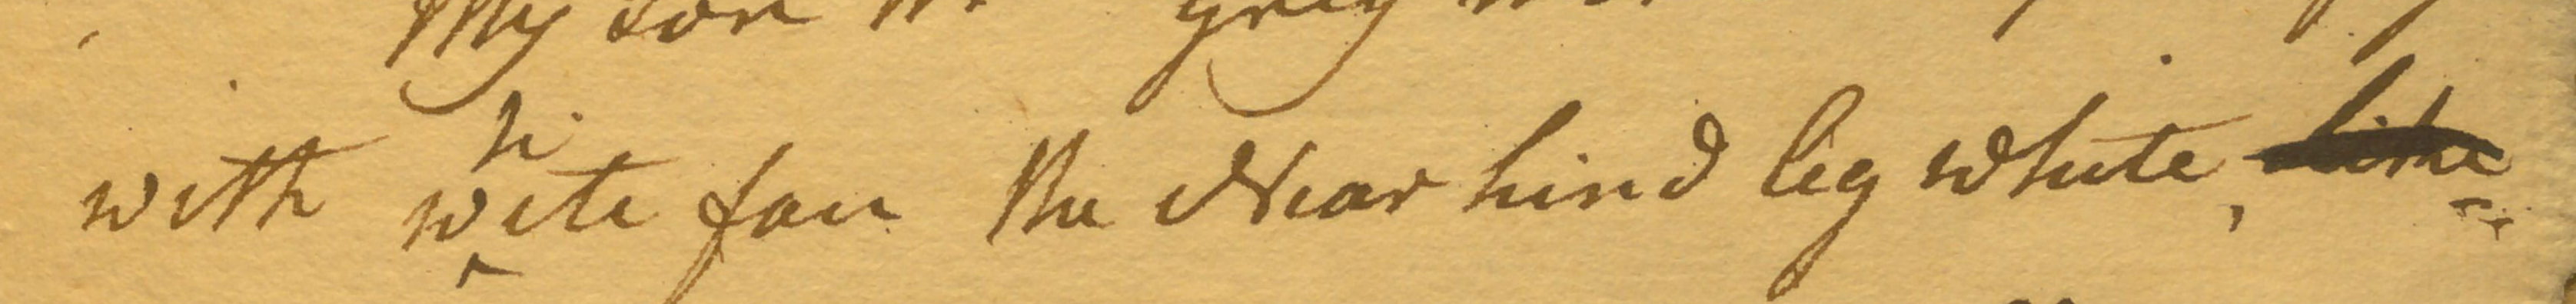with w^hite fan the Near hind leg white [Like]
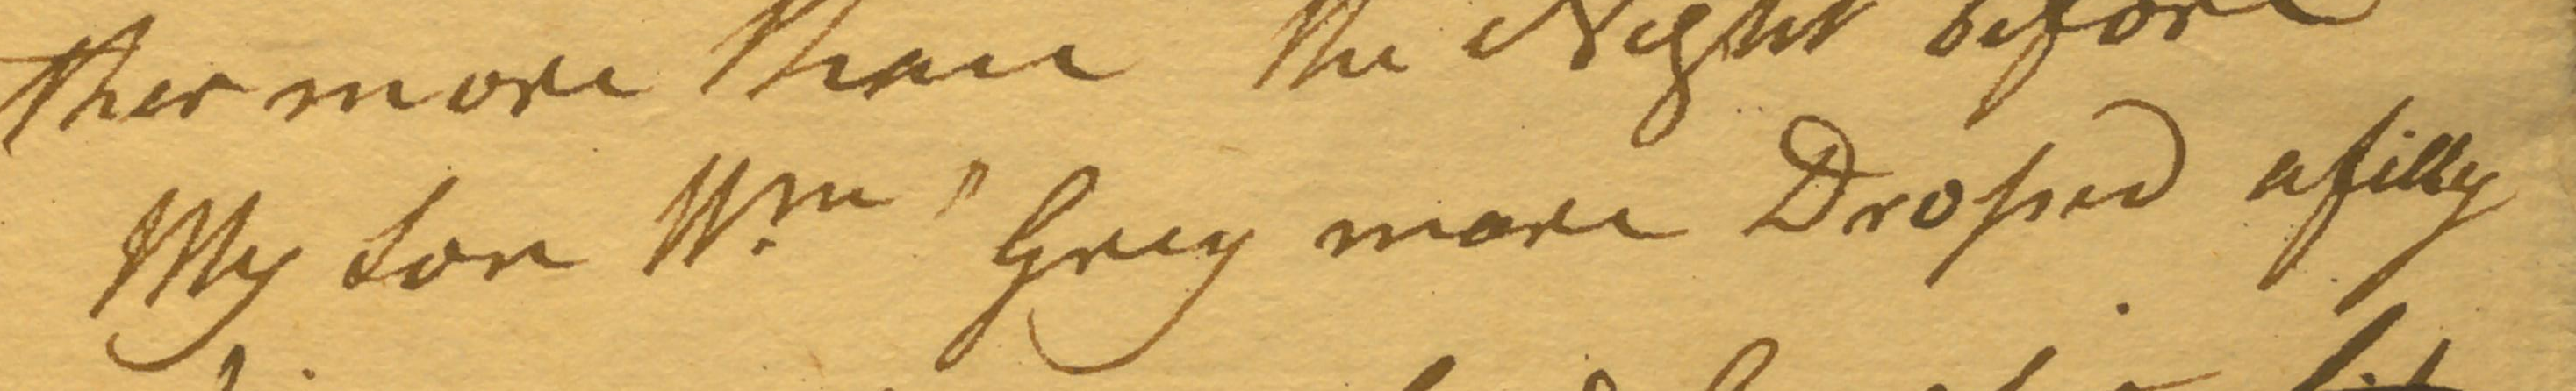My Son W^m. Grey mare Droped a filly
